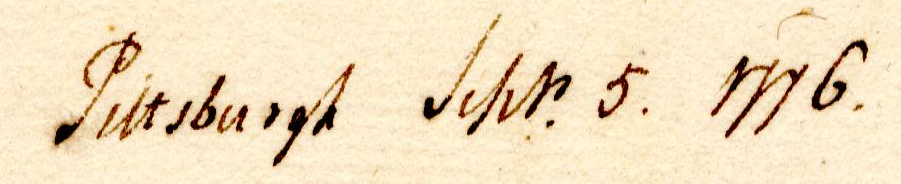Pittsburgh Sept^r. 5. 1776.
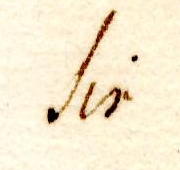Sir
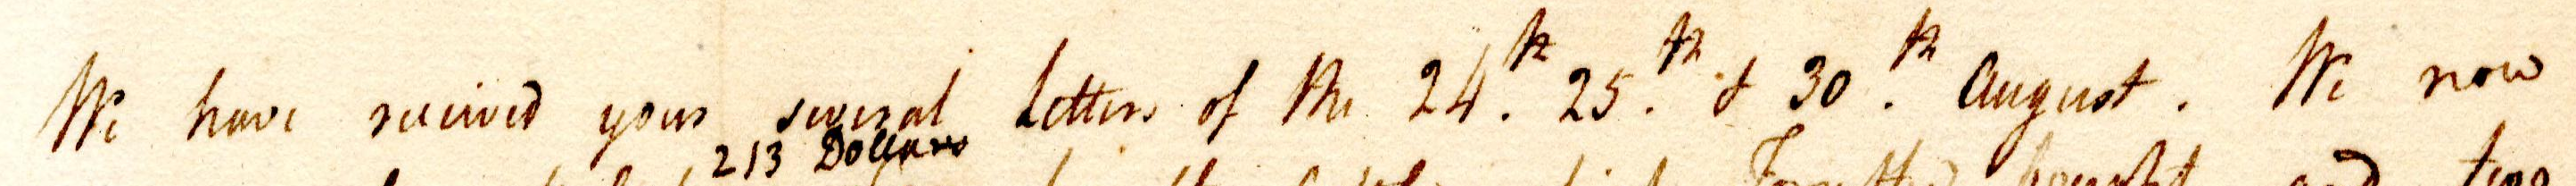We have received your several Letters of the 24^th. 25^th. & 30^th. August. We now
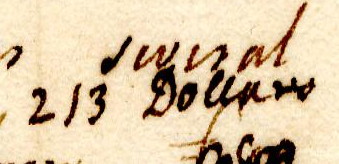213 Dollars
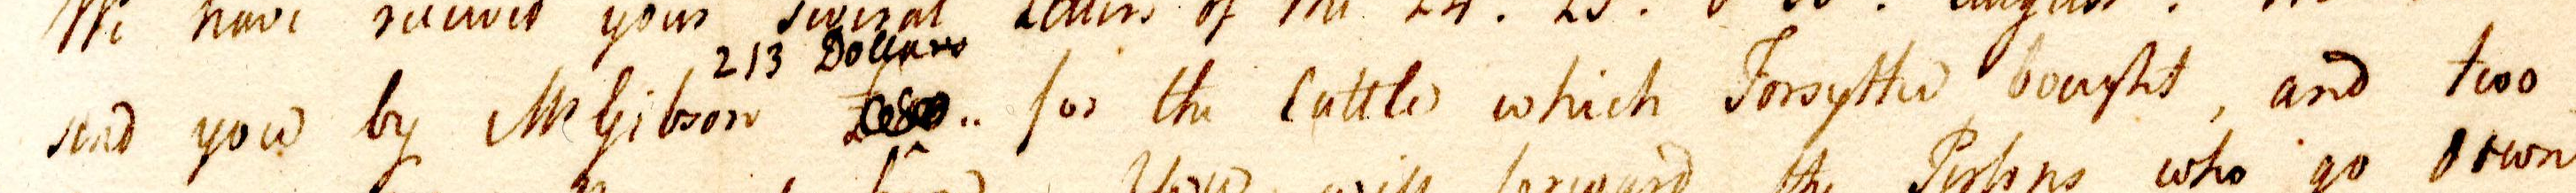send you by M^r Gibson ^ [___] for the Cattle which Forsythe bought, and two
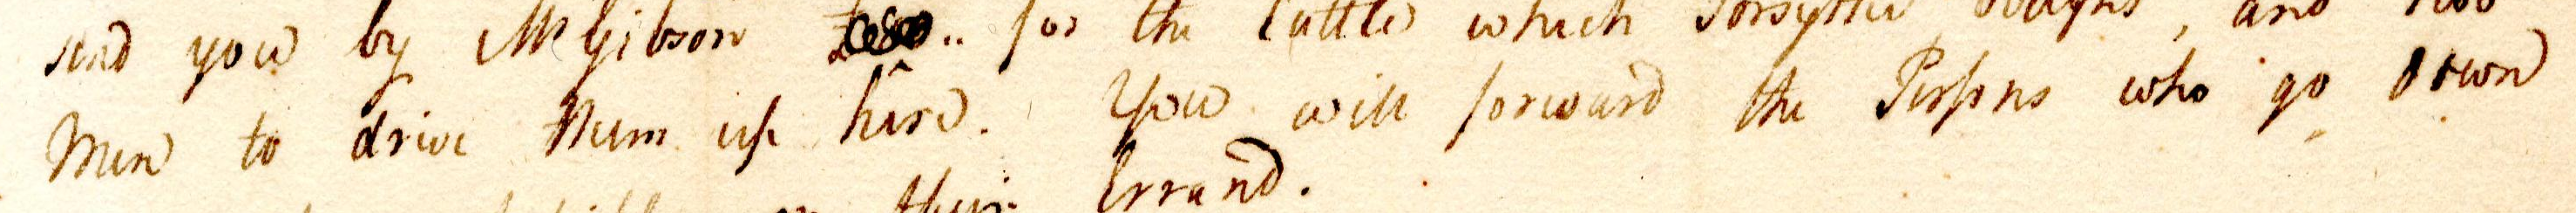Men to drive them up here. You will forward the Persons who go down
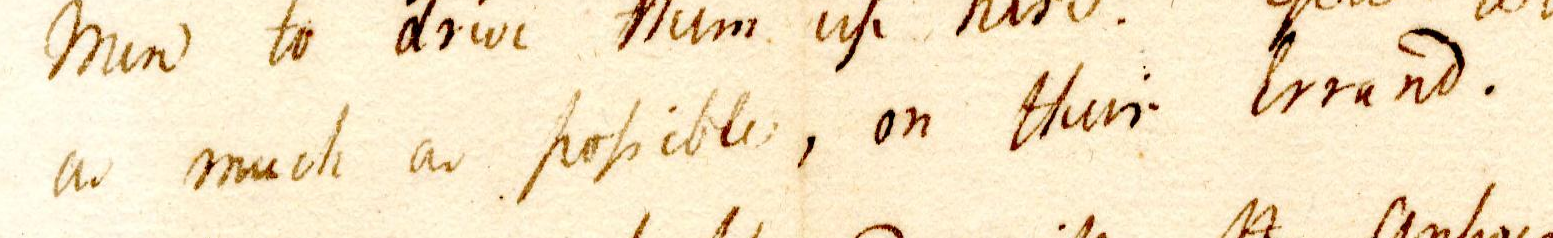as much as possible, on their Errand.
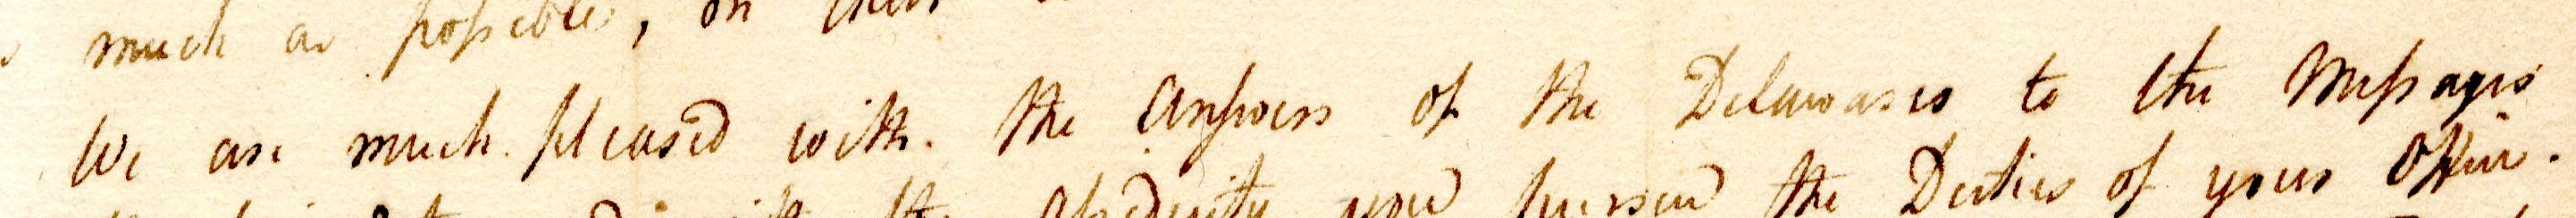We are much pleased with. the Answers of the Delawares to the Messages
